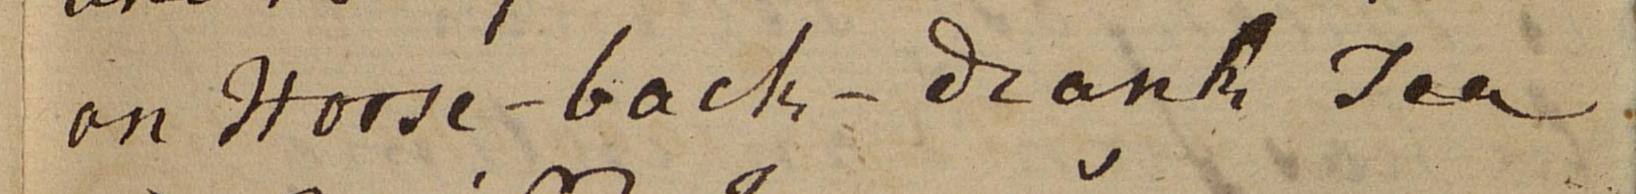on Horse- back- drank Tea
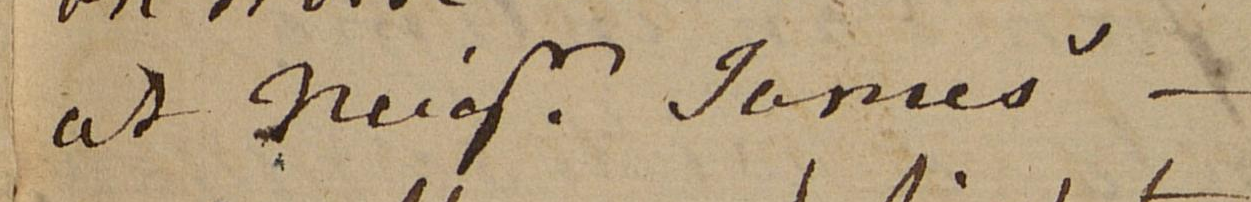at Neig^r. James^s-
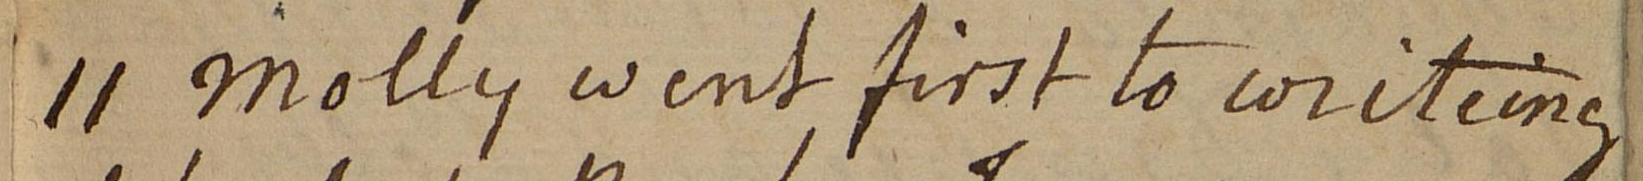11 Molly went first to writeing
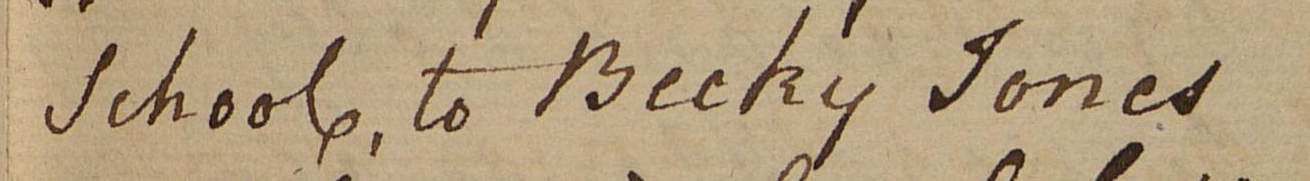School, to Becky Jones
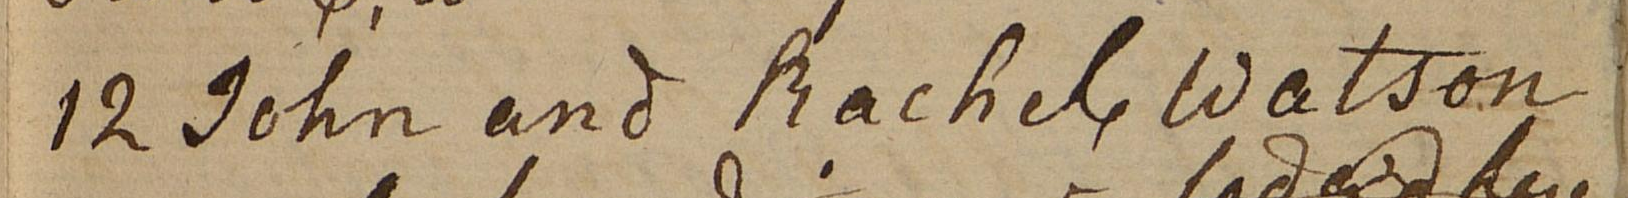12 John and Rachel Watson
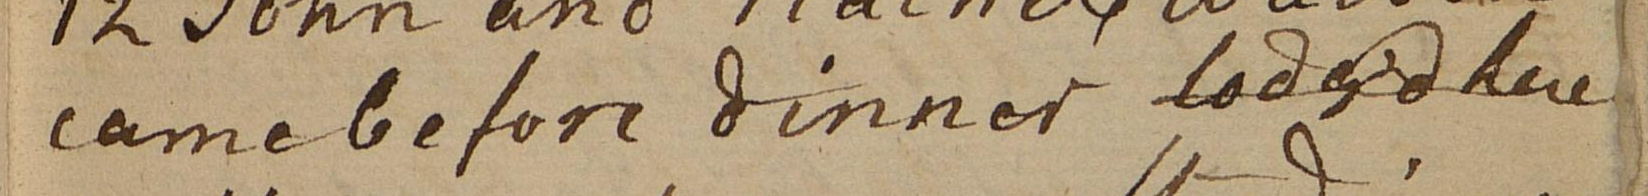came before dinner lodg'd here
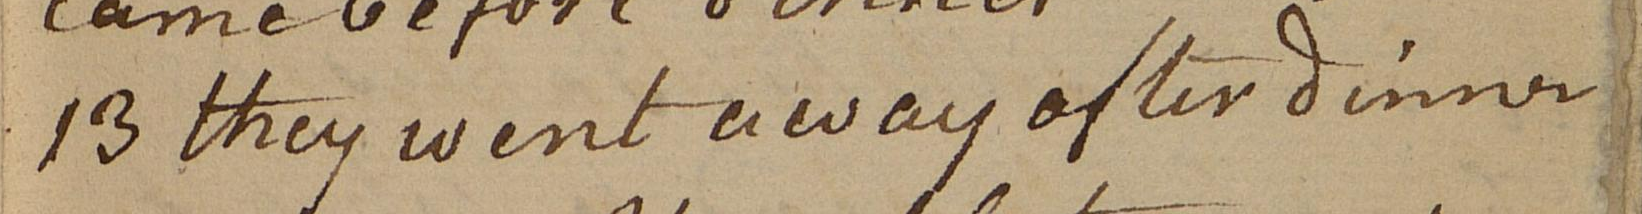13 they went away after dinner
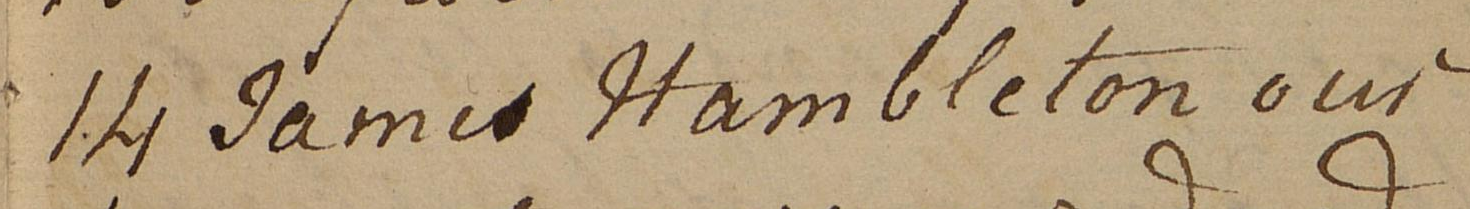14 James Hambleton our
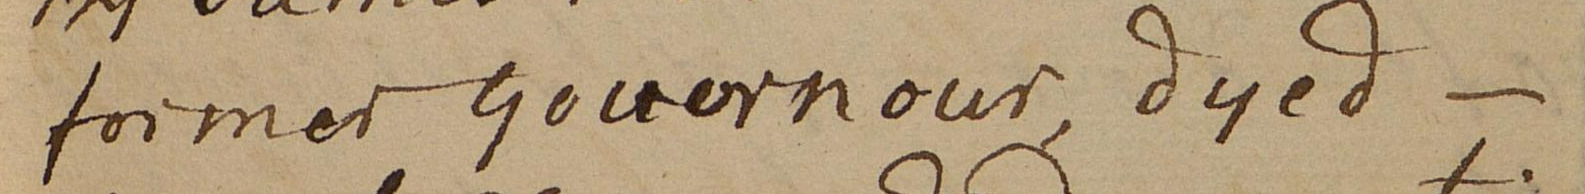former Governour, dyed-
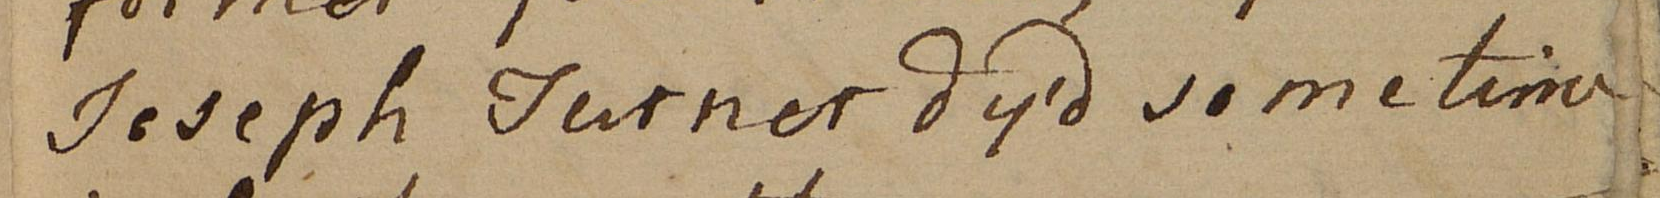Joseph Turner dy'd some time
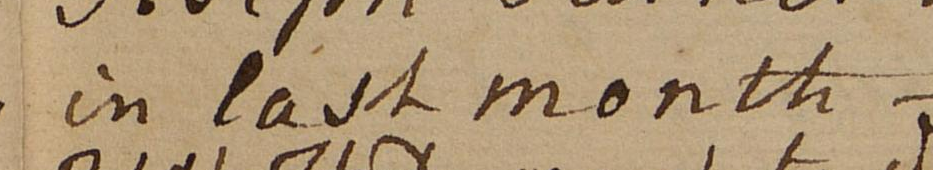in last month-
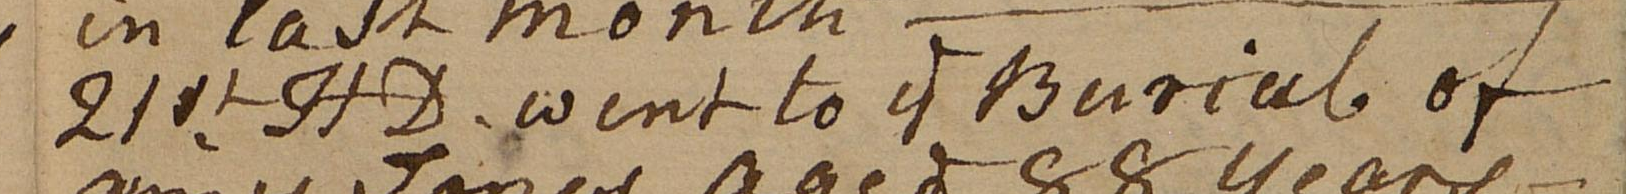21^st H D- went to y^e Burial of
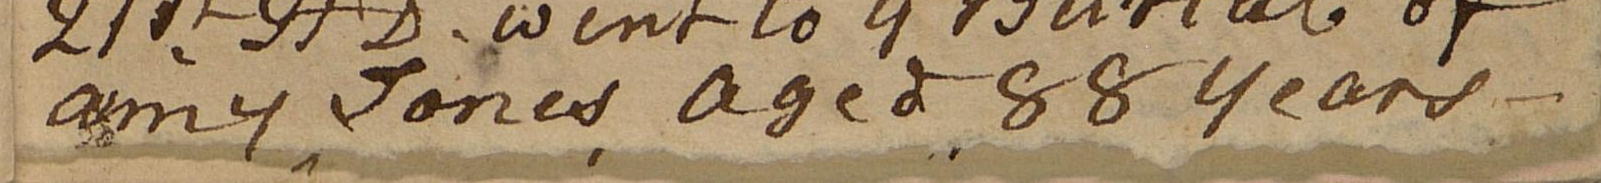Amy Jones, aged 88 years-
